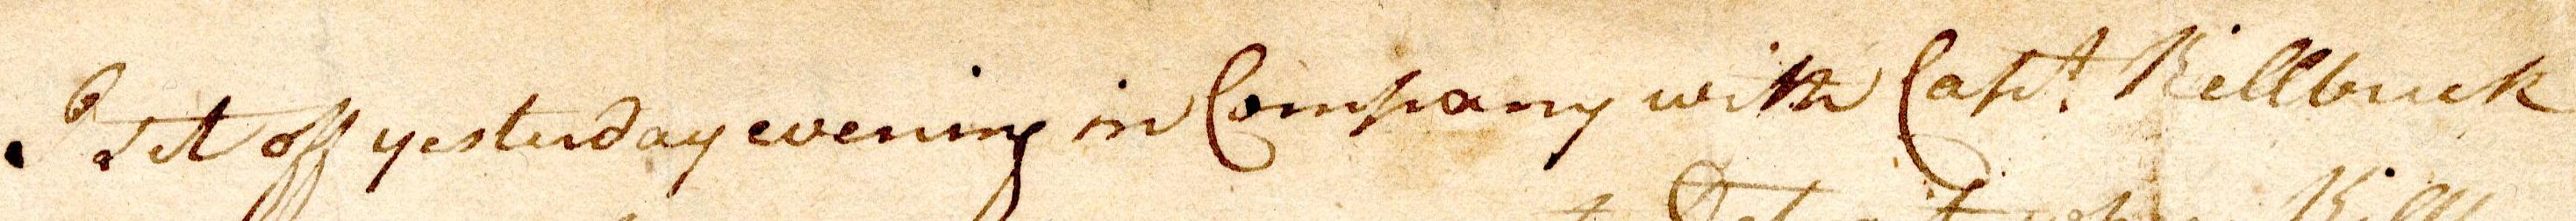set off yesterday evening in Company with Cap^t. Killbuck
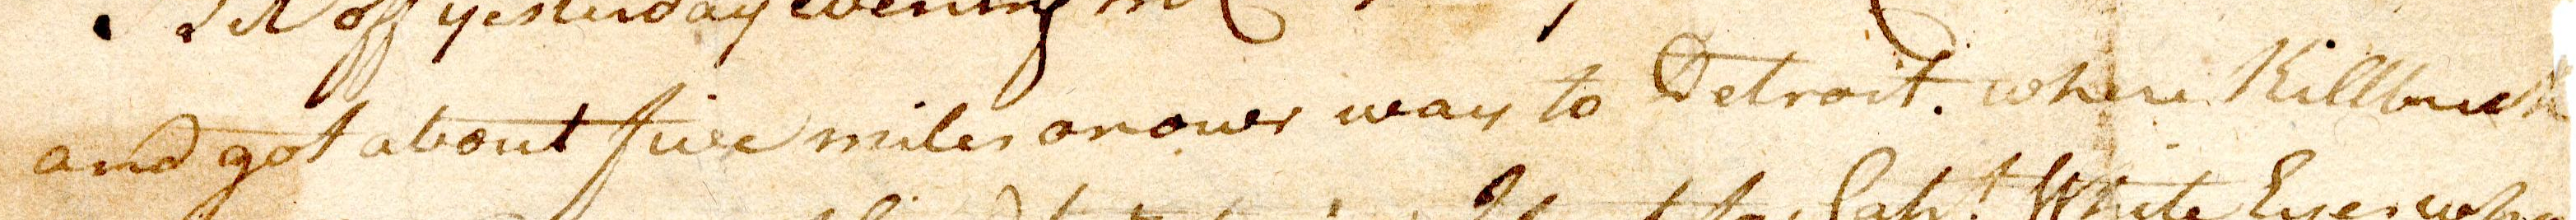and got about five miles on our way to Detroit. where Killbuck
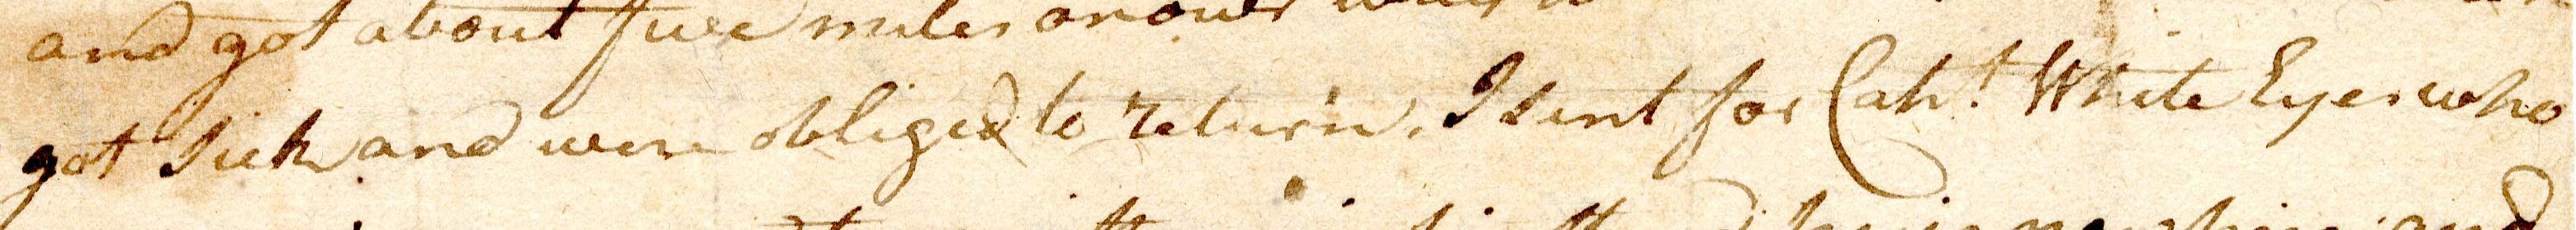got sick and were obliged to return. I sent for Cap^t. White Eyes who
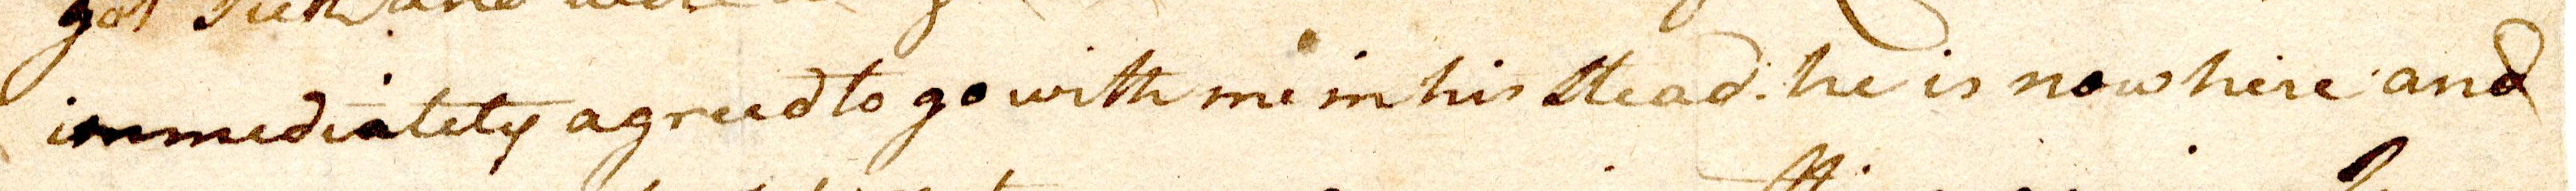immediately agreed to go with me in his stead. he is now here and
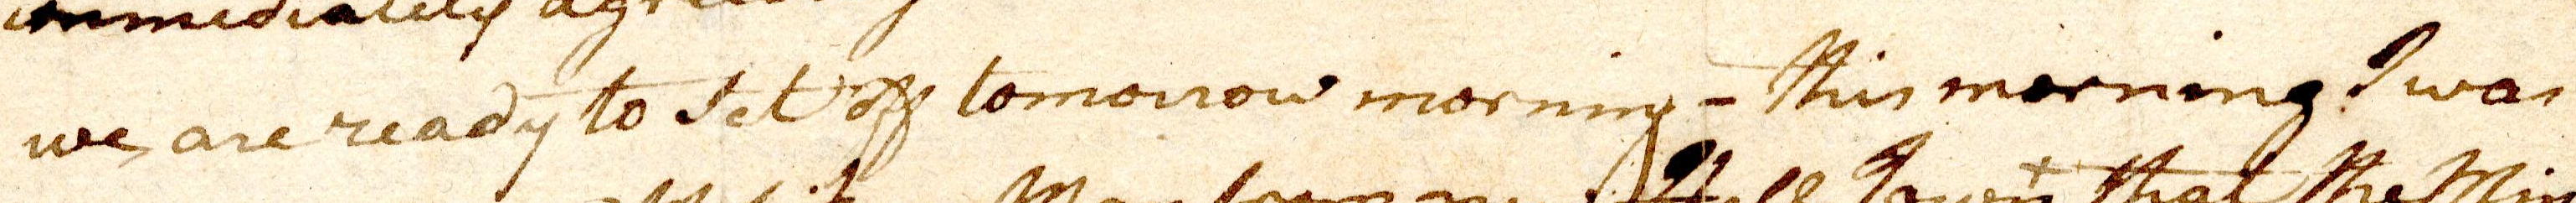we are ready to set off tomorrow morning- this morning I was
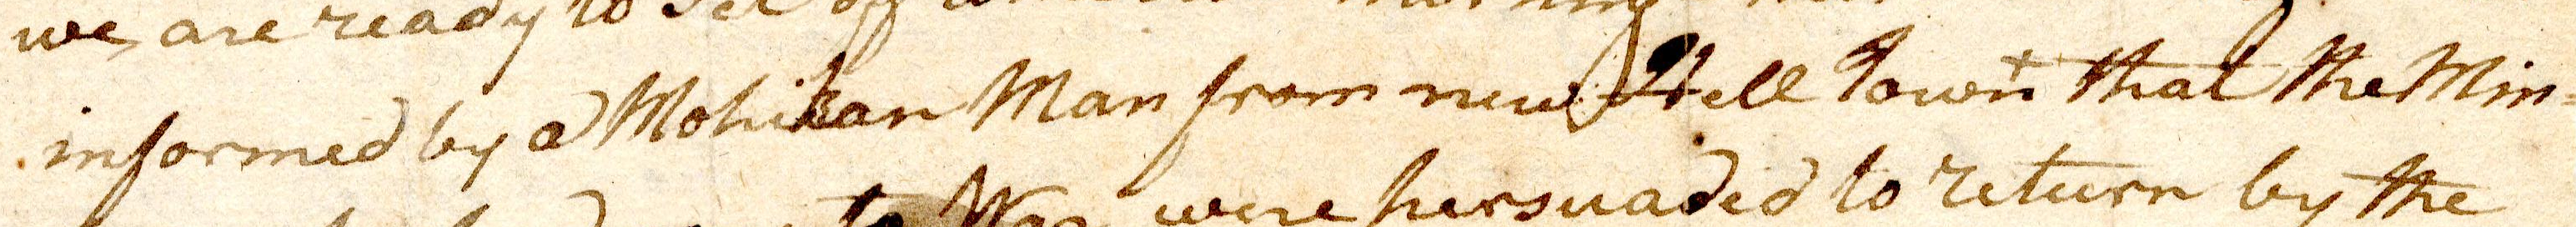informed by a Mohikan Man from new Hell Town that the Min-
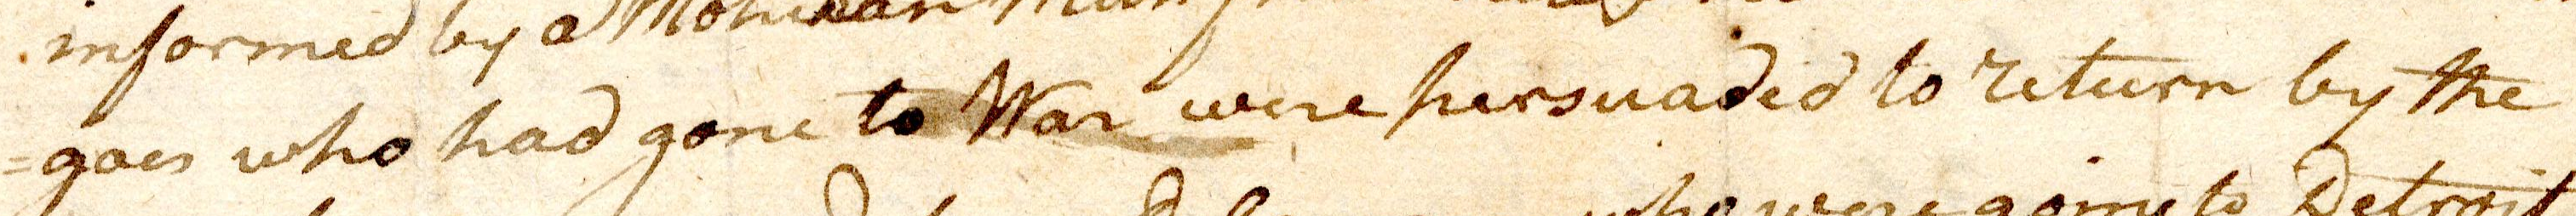-goes who had gone to War were persuaded to return by the
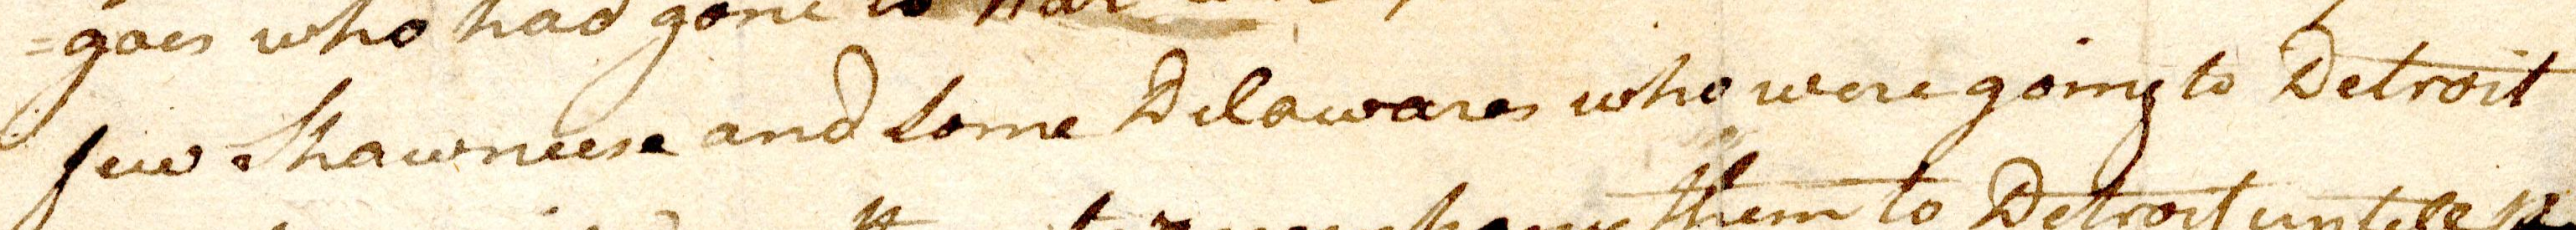few Shawneese and some Delawares who were going to Detroit
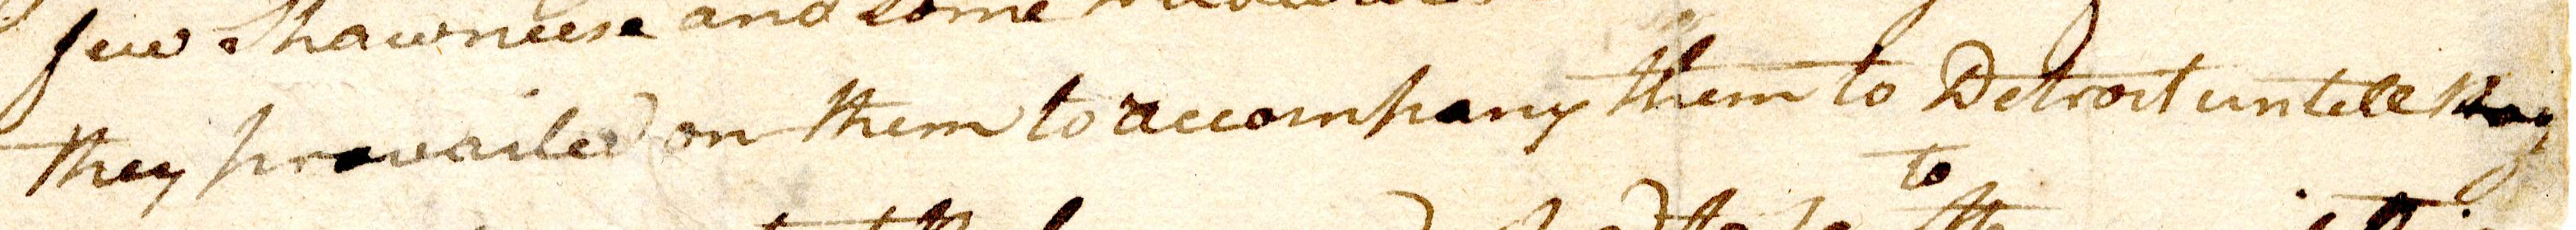they prevailed on them to accompany them to Detroit until they
